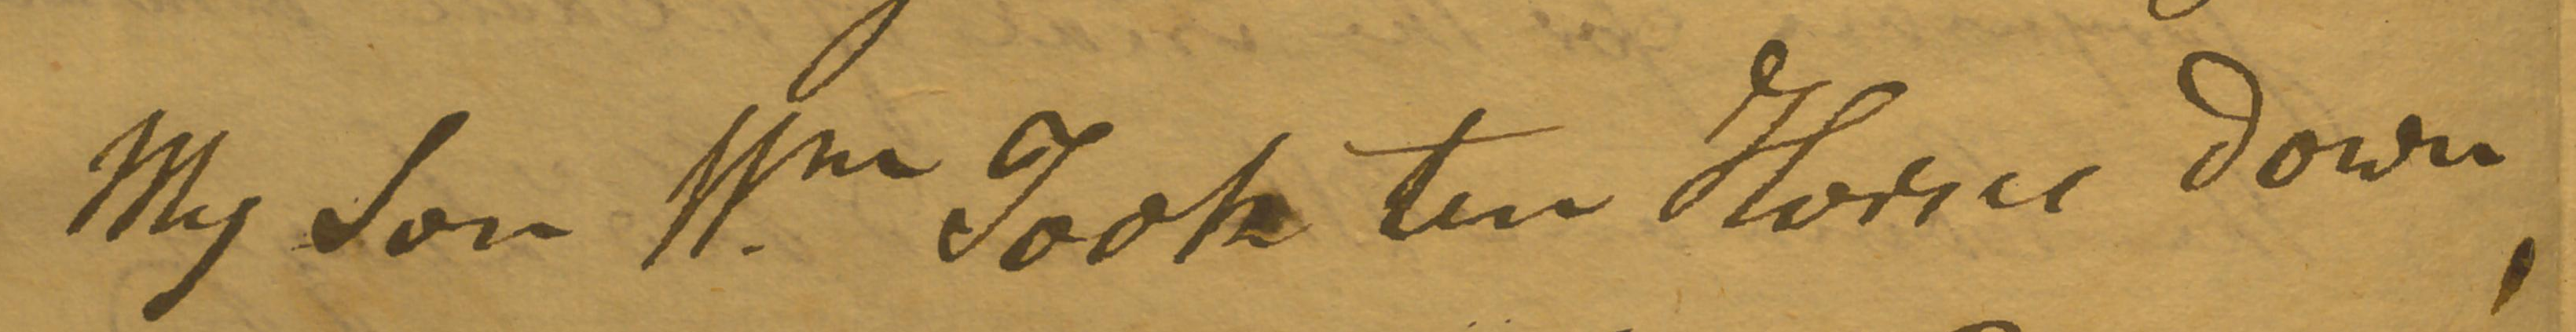My Son W^m. Took ten Horses down
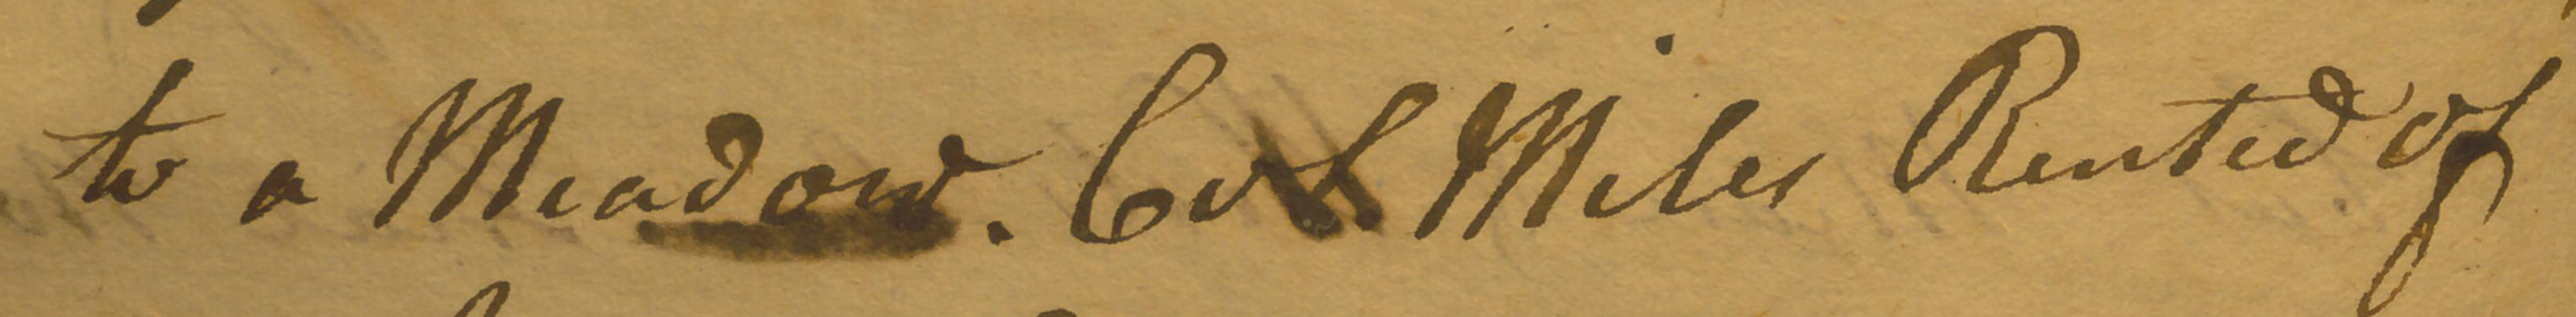to a Meadow. Col. Miles Rented of
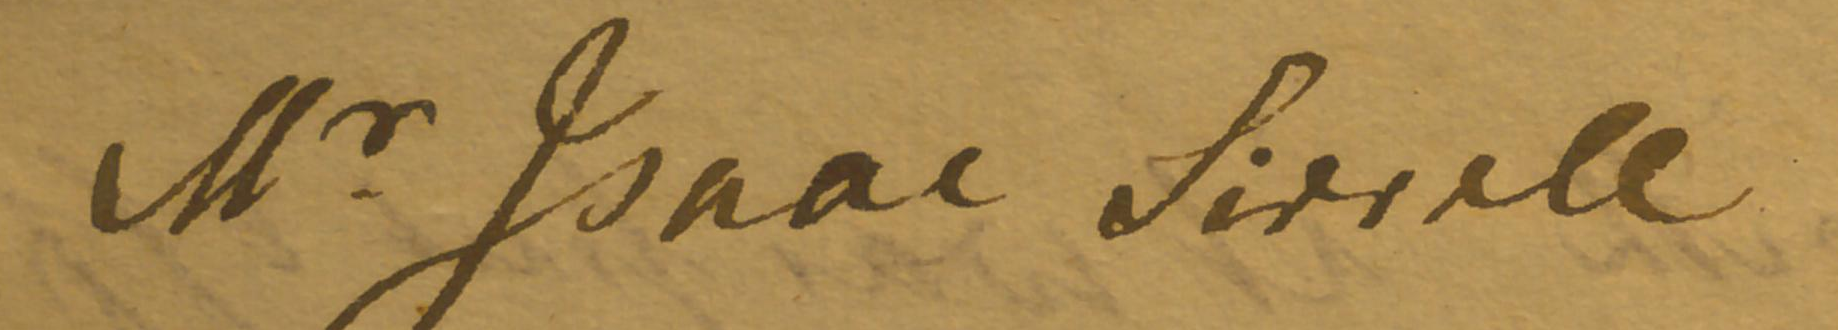M^r. Isaac Sirrell
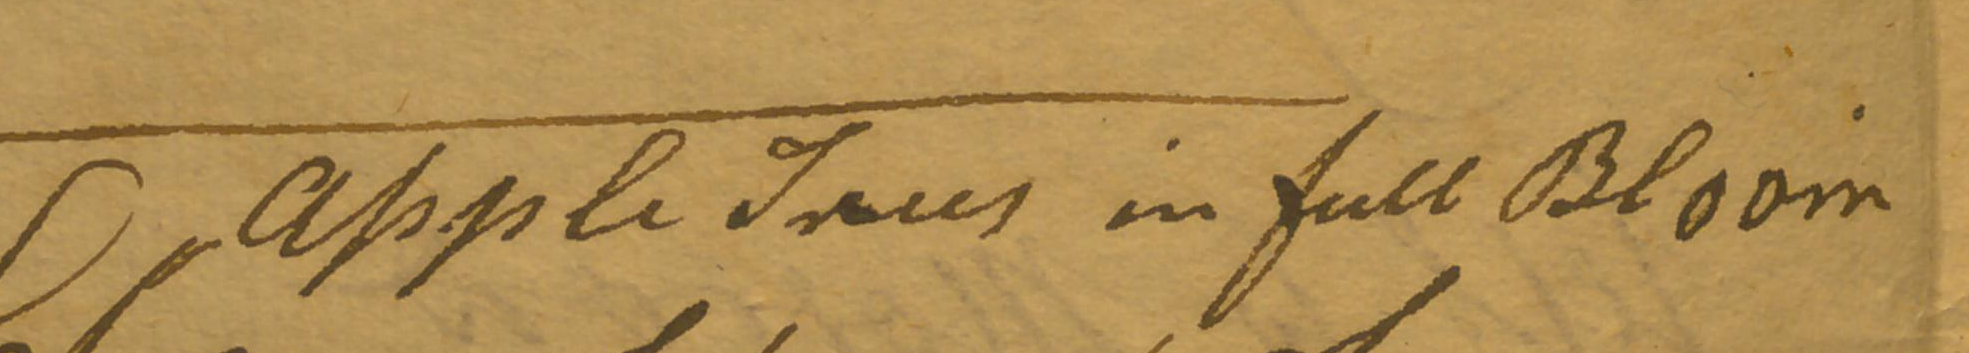Apple Trees in full Bloom
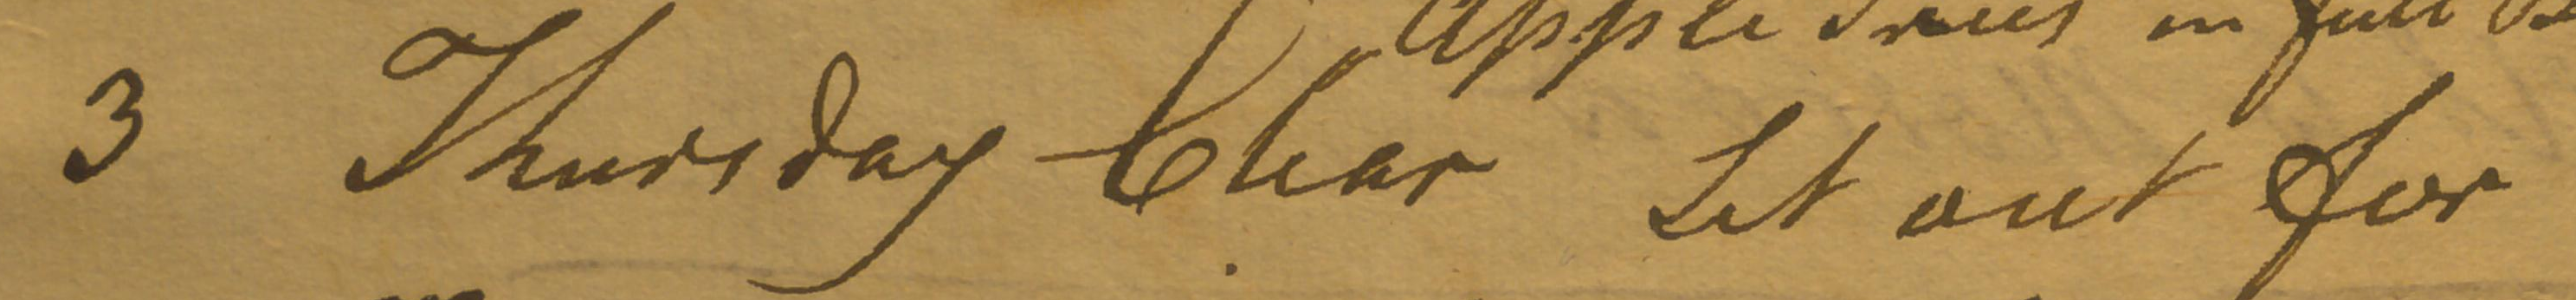3 Thursday Clear set out for
